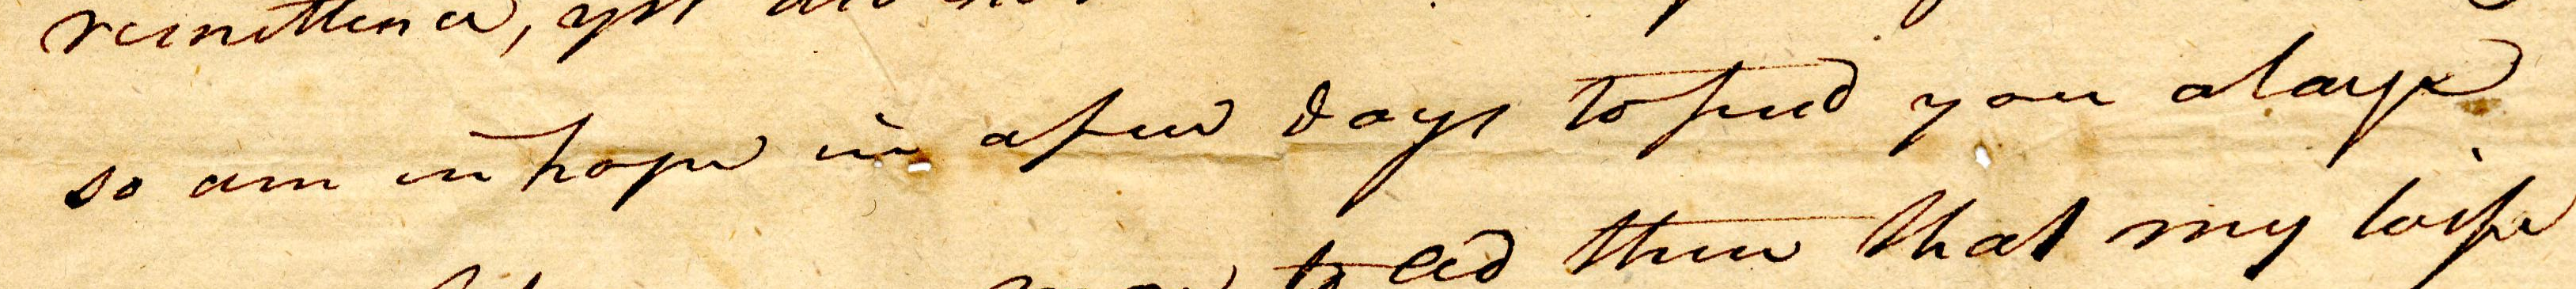so am in hope in a few days to send you a large
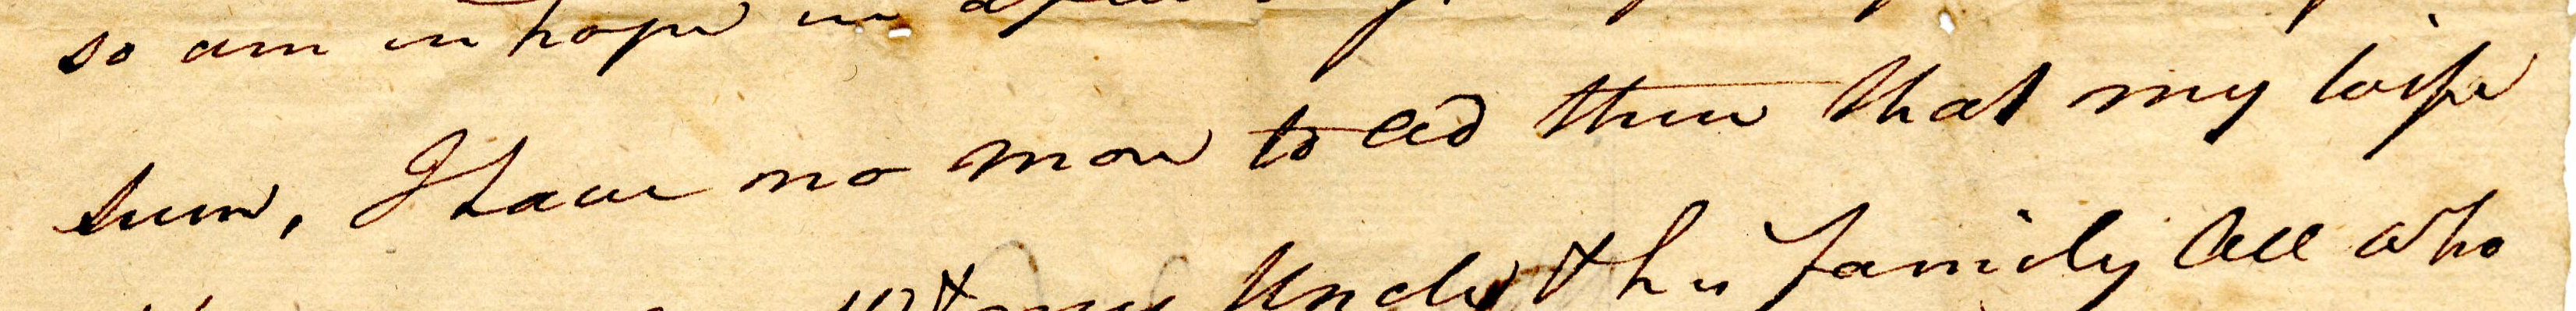sum, I have no more to ad then that my wife
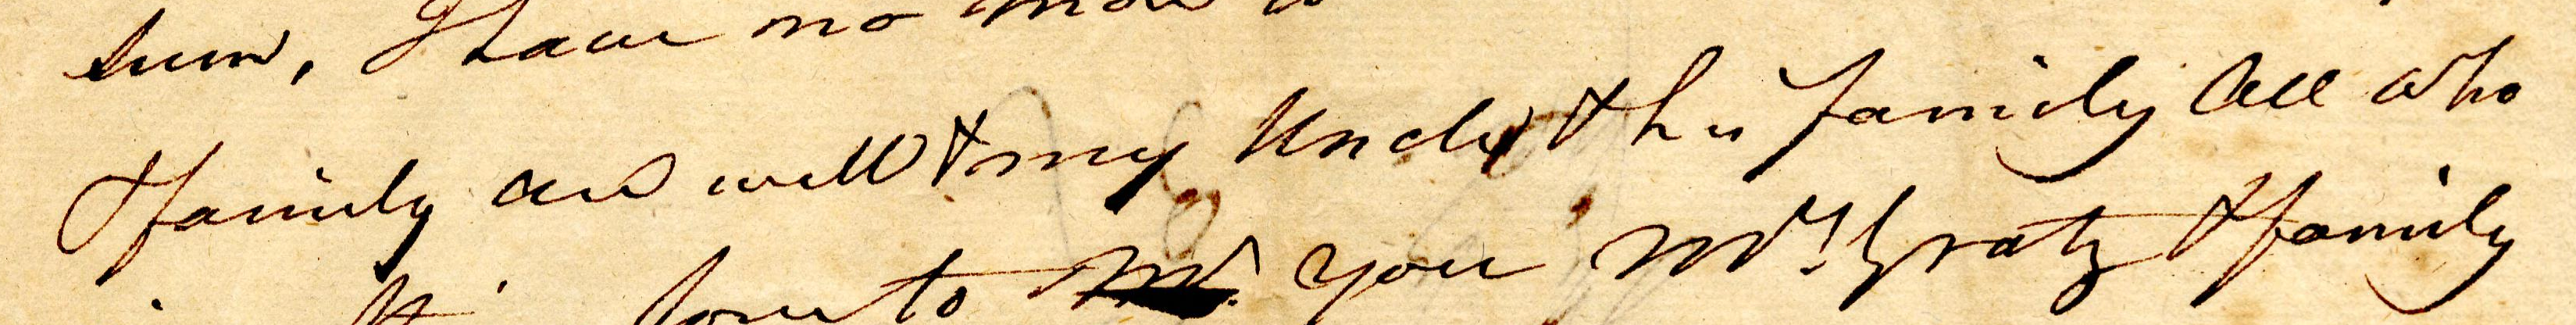& family are well & my^ Uncle & his family All who
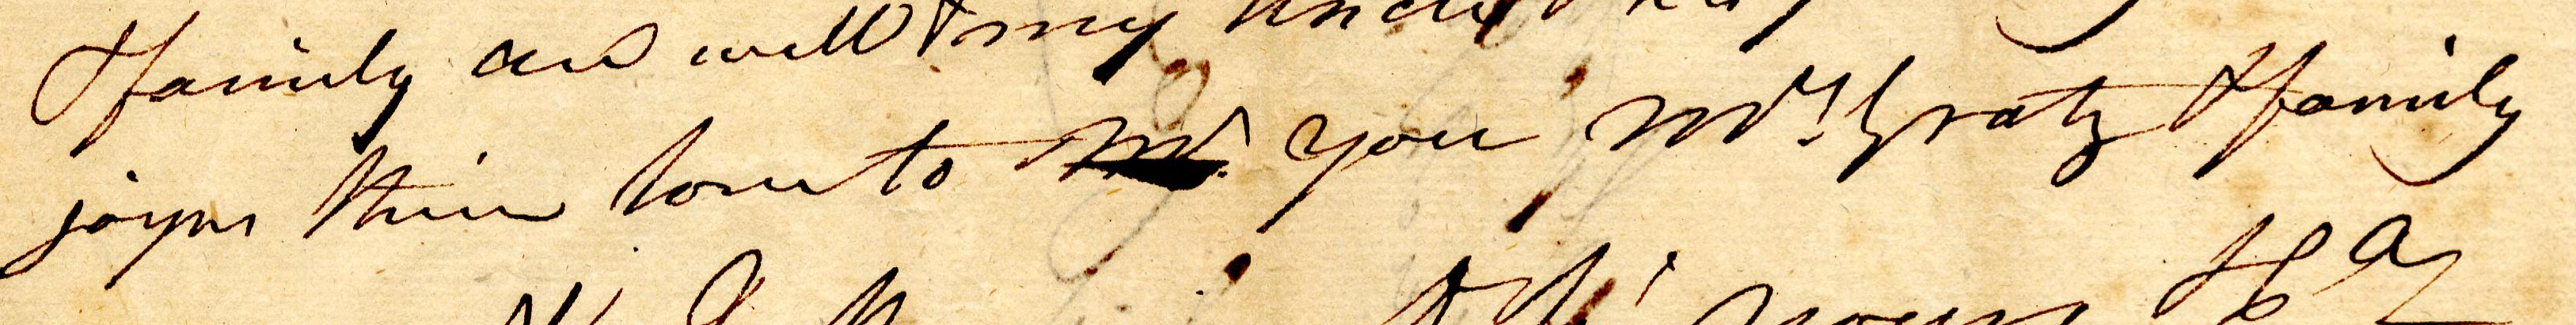joyns their love to [M^r] you M^rs Gratz & family
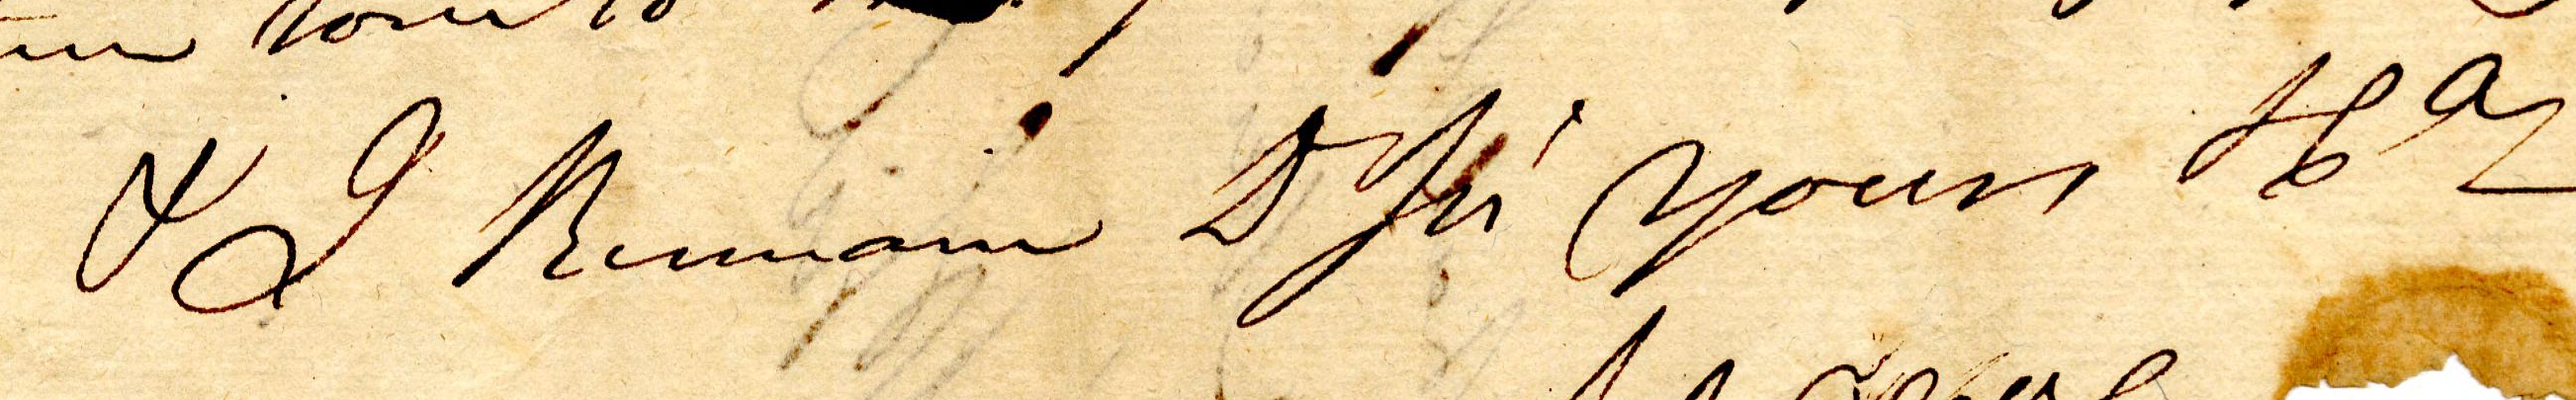& I Remain D^r sir Yours H^e
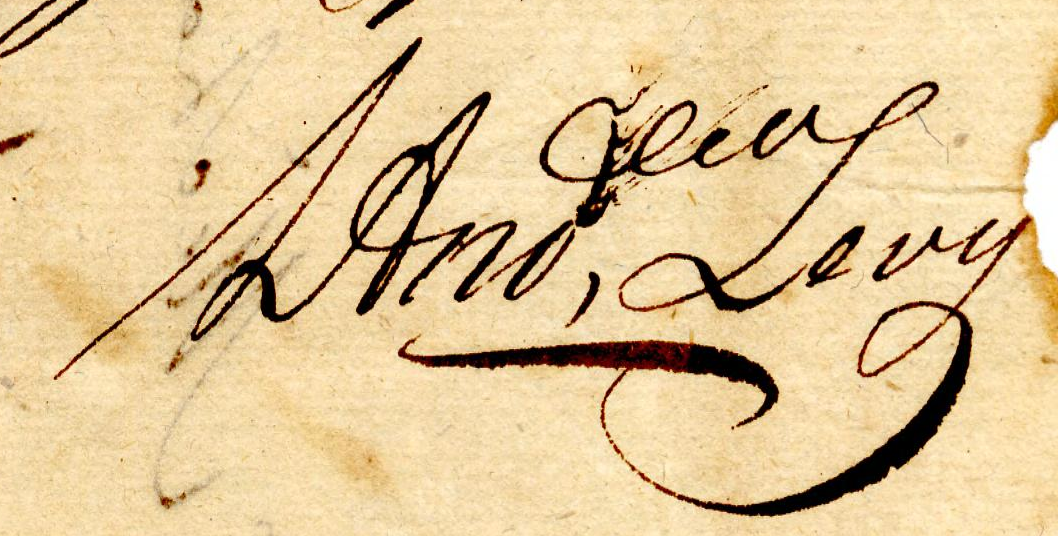And^rew Levy
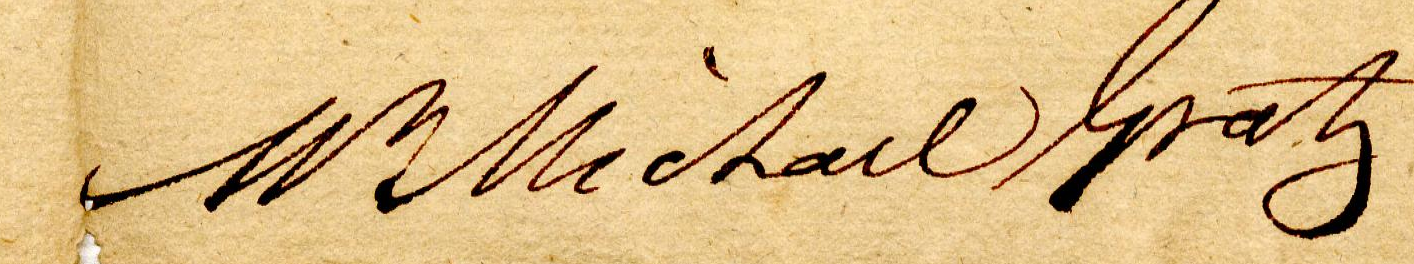M^r Michael Gratz
